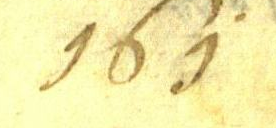161
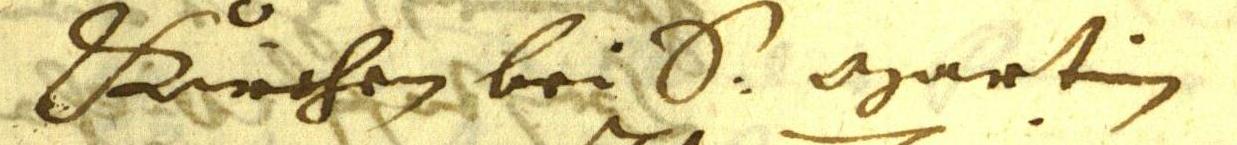Kirchen bei S: Martin
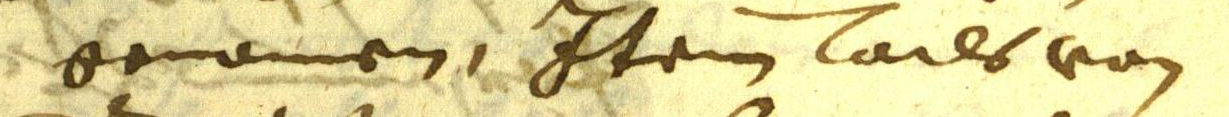genomen, Item Tails von
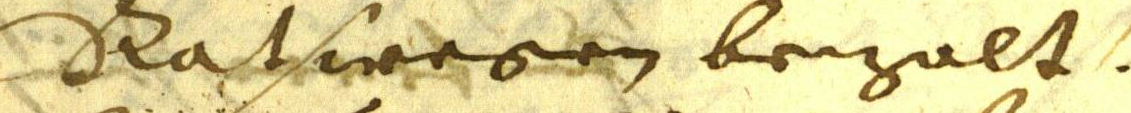Ratswegen bezalt.
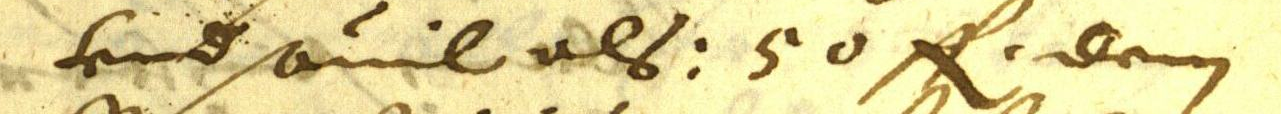vnd soūil als: 50 fl. dem
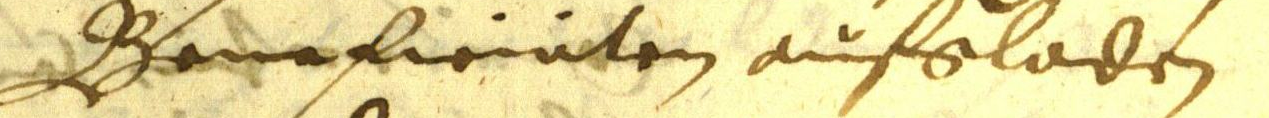Beneficiaten aūfgladen
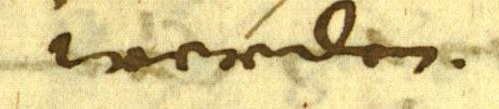werden.
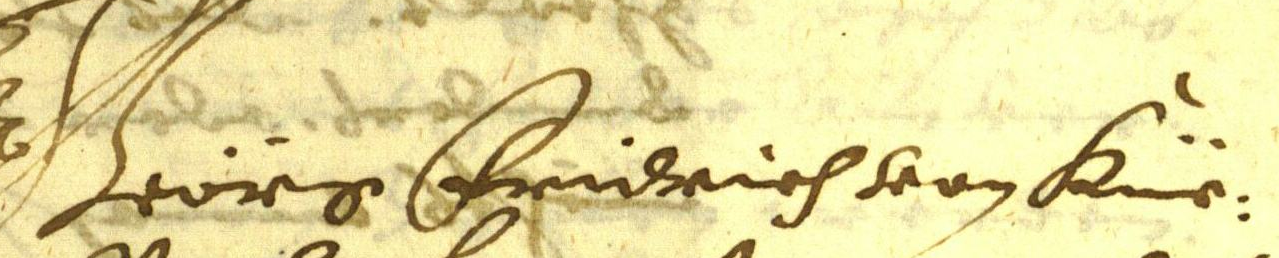Hl Geörg Fridrich von Küe¬
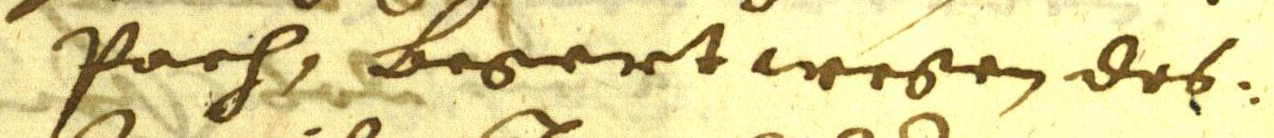Pach, Begert wegen des:
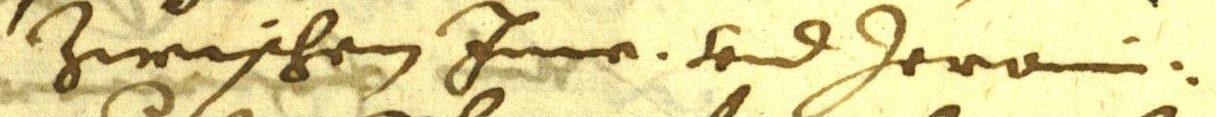Zwischen Ime. vnd Jeroni¬
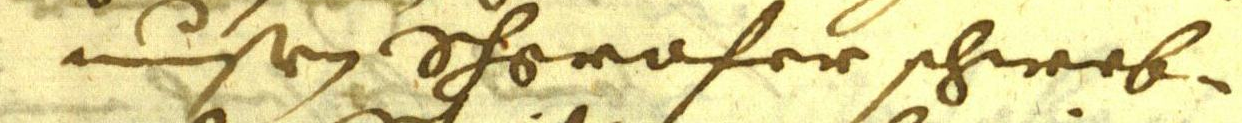mūsen Schgrafer schweb¬
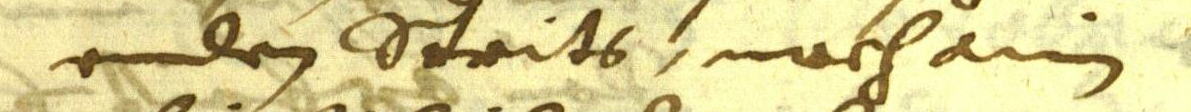enden Strits, noch aim
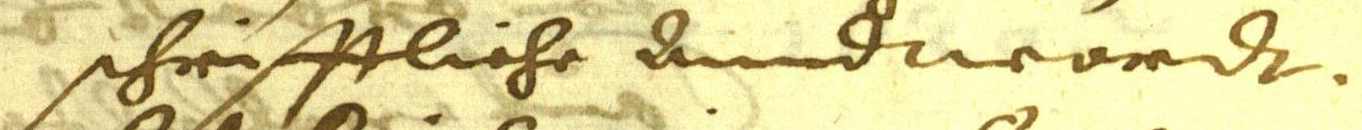schrifftliche Anndtwordt.
